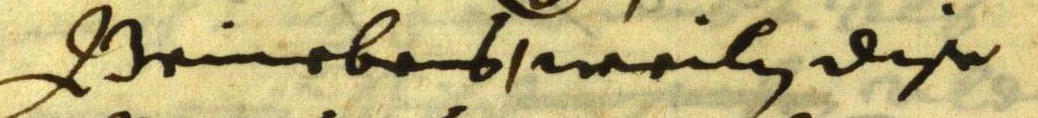Beinebens, weiln dise
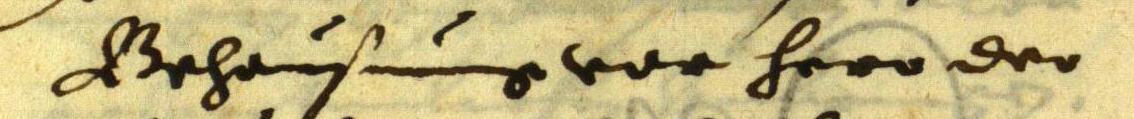Behaūsūng vor hero der
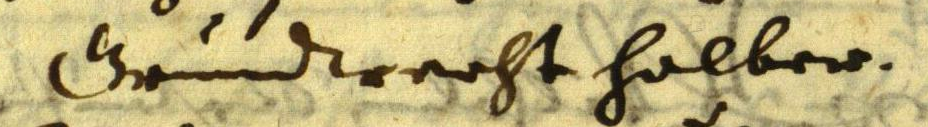Grūndtrecht halber.
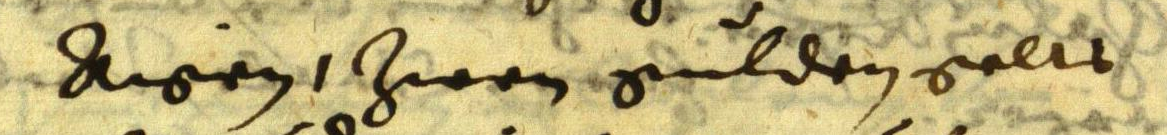Aigen, Zwen gūlden gelts
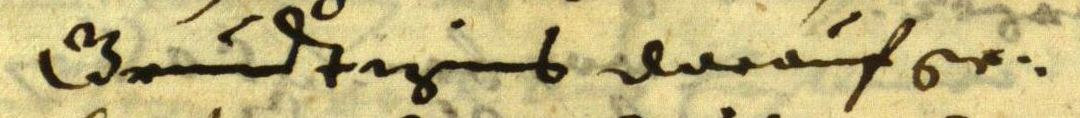Grūndtzins daraūf ge¬
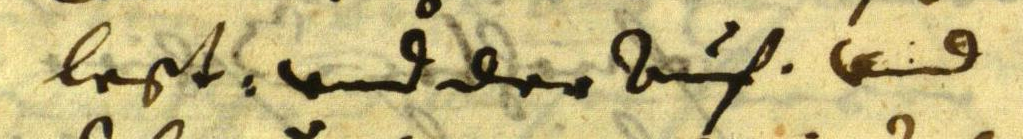legt: vnd der Aūf. vnd
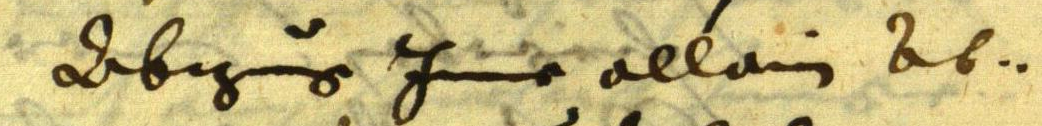Abzūg Ime allain Ab¬
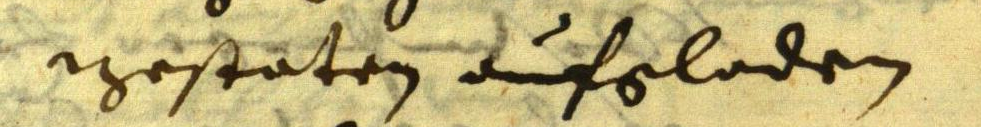zestaten aūfgladen
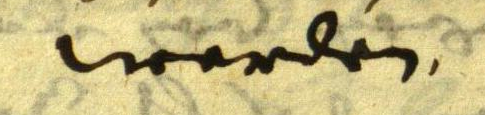werden.
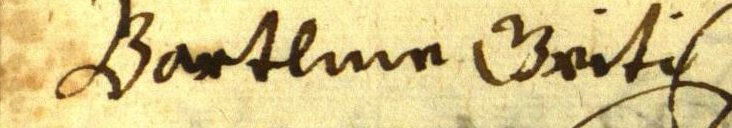Bartlme Griti
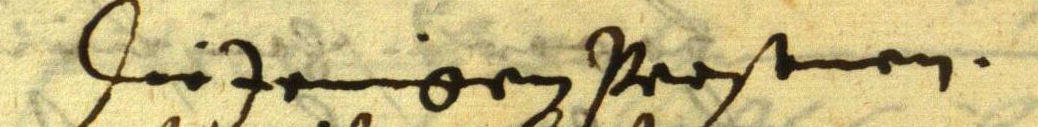Die Jenigen Personen.
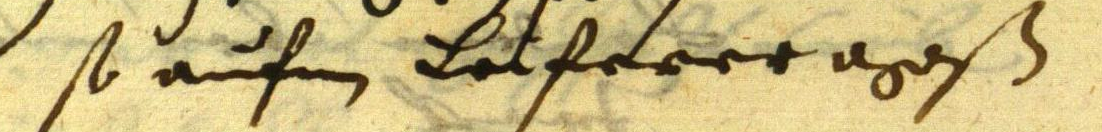so aūfm Leiferer Moß
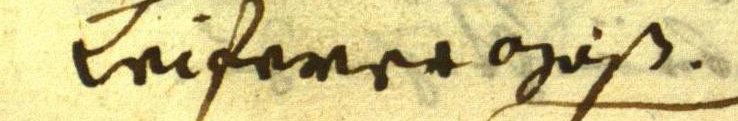Leiferer Moß.
